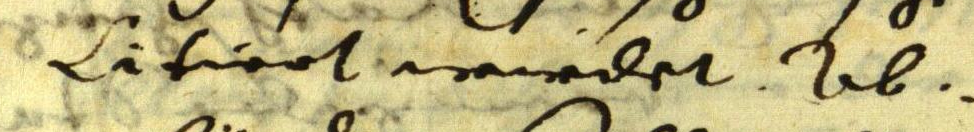Citiert wirdet. Ab¬
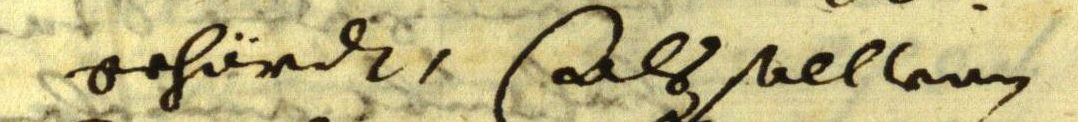gehördt, Als soll von
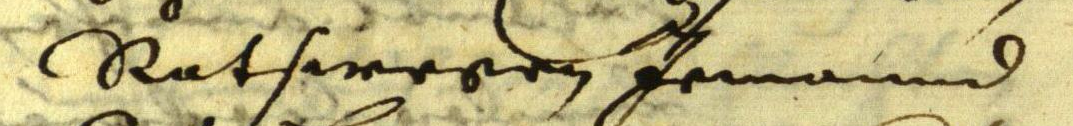Ratswegen Jemannd
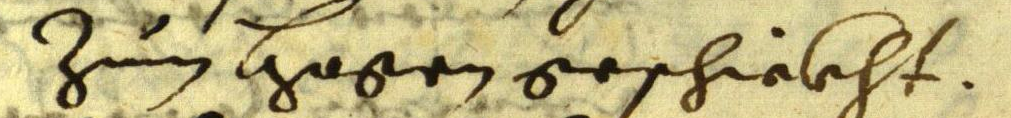Zūm Hagen geschickht.
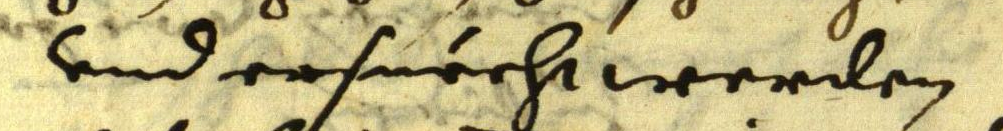vnd ersūecht werden
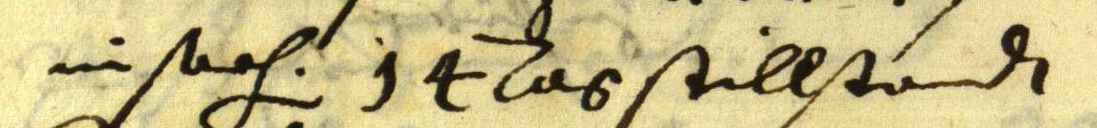in sach. 14 Tag stillstandt
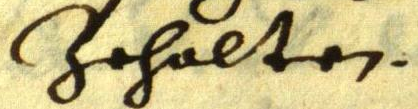Zehalten.
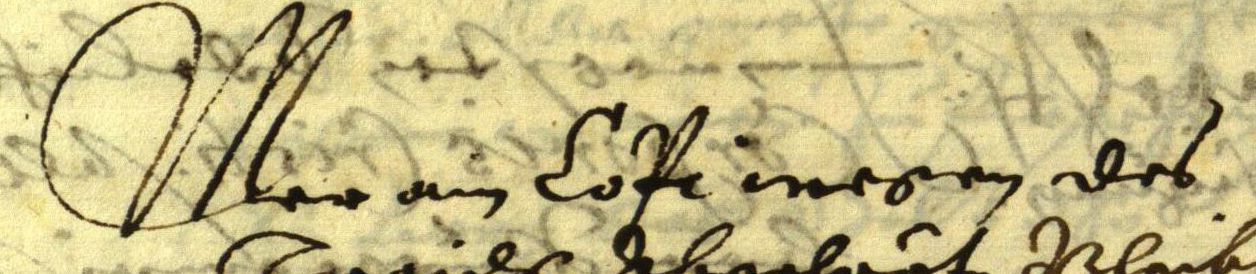Mer ain CoPi wegen des
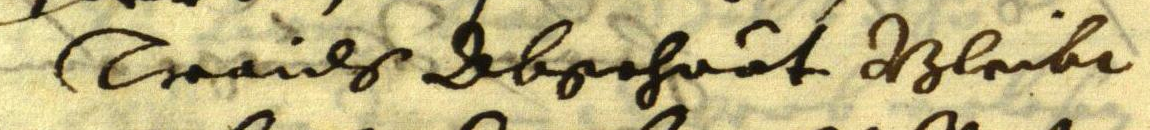Traids Abgehōrt. Bleibt
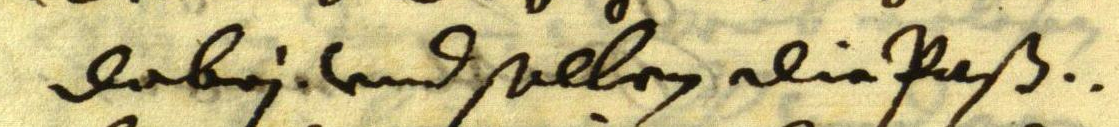dabej. vnd sollen die Paß¬
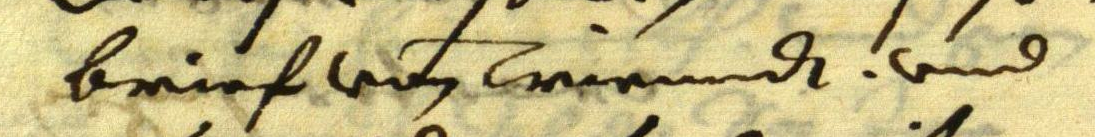brief von Trienndt. vnd
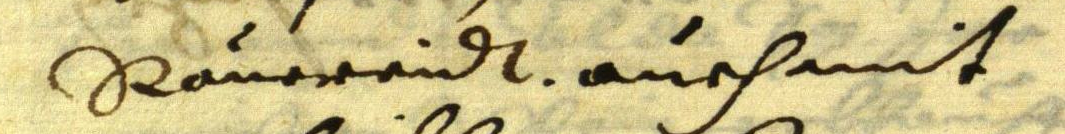Roūereidt. aūch mit
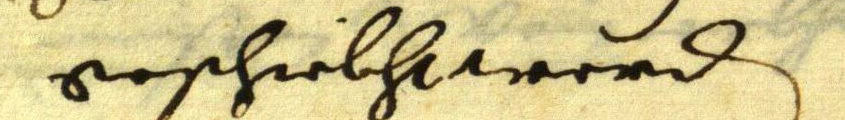geschickht werd.
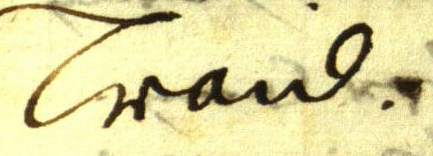Traid
